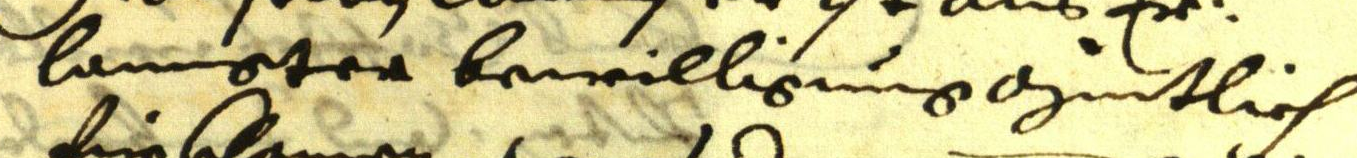lanngter bewilligūng mintlich
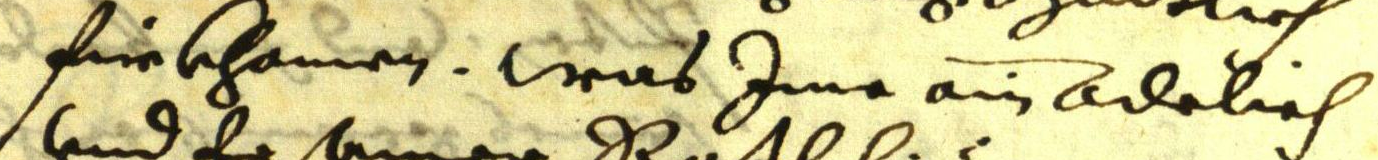firkhomen. was Ime ain Adelich
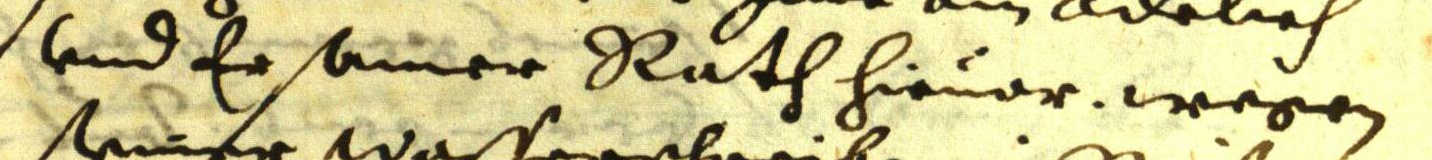vnd Ersamer Rath hieūor. wegen
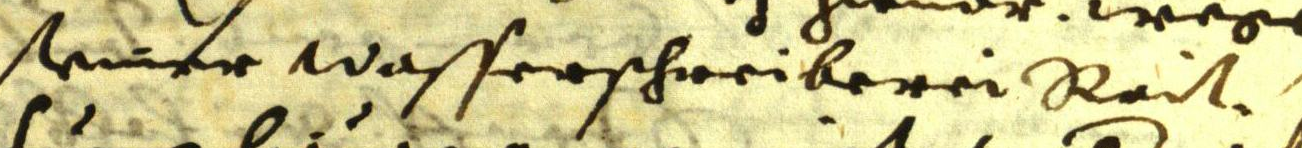seiner Wasserschreiberei Rait¬
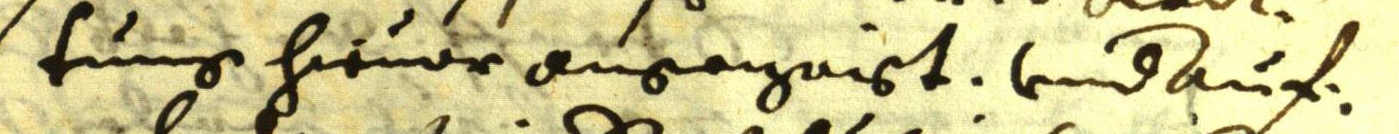tūng hieūor angezaigt. vnd aūf¬
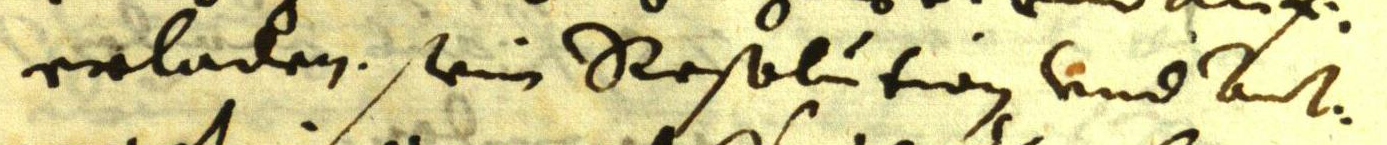erladen. sein Resolūtion vnd Ant¬
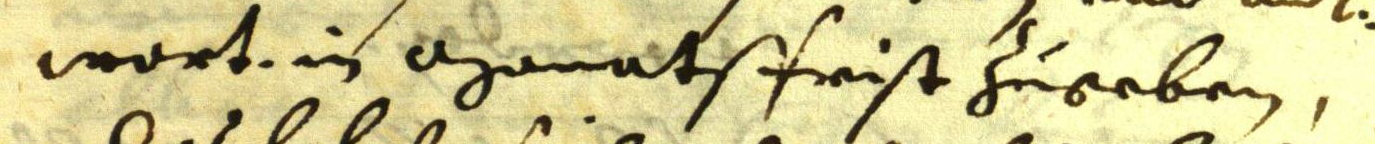wort. in Monatsfrist Zūgeben.
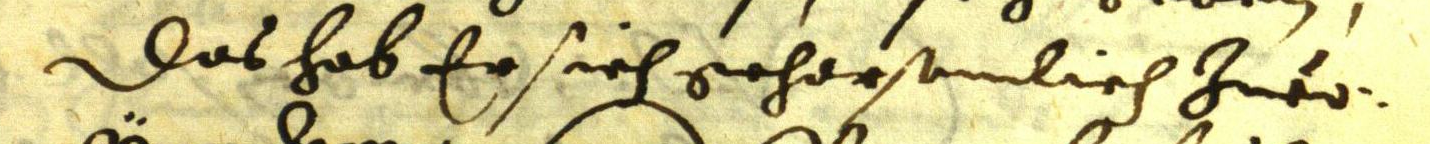Das hab Er sich gehorsamlich Zūer¬
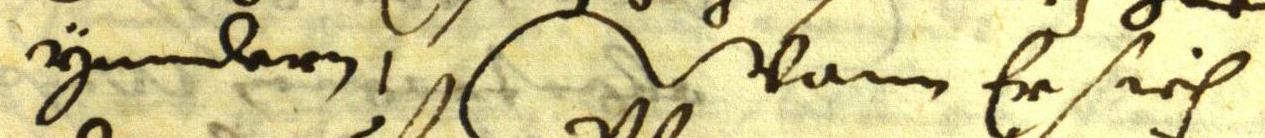ÿnndern, Wann Er sich
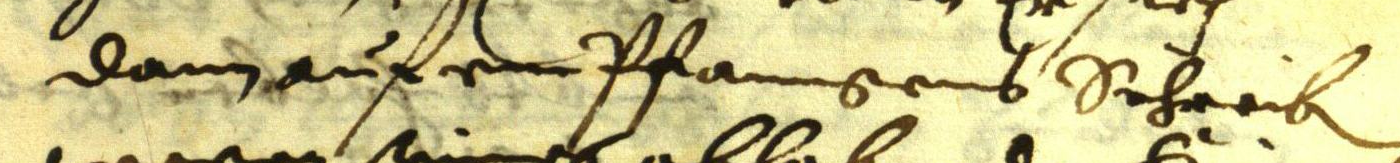dann aūf emPfanngens Schreib
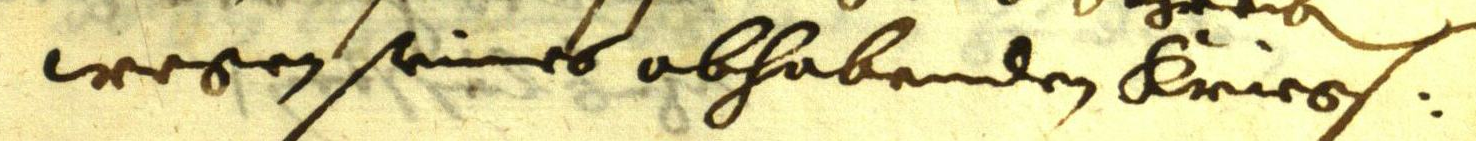wegen seines obhabenden Kriegs¬
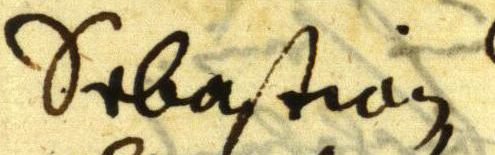Sebastian
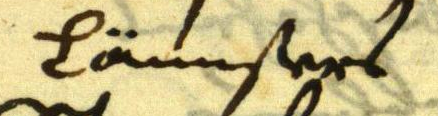Lännsers
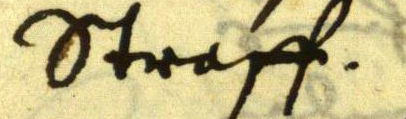Straff.
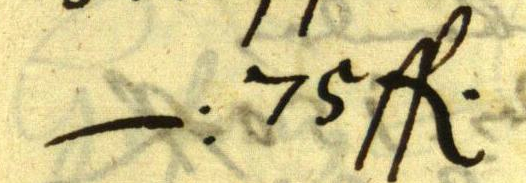—: 75 fl.
